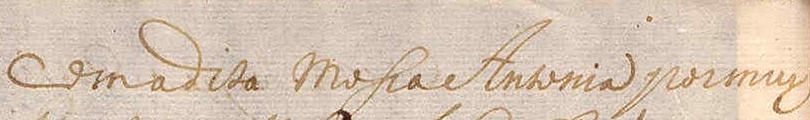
com a dita mossa Antonia por muy
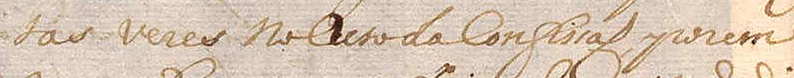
tas vezes no Acto da Confissaõ, porem
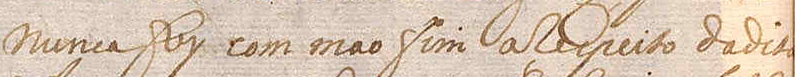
nunca foy com mao fim a respeito da dita
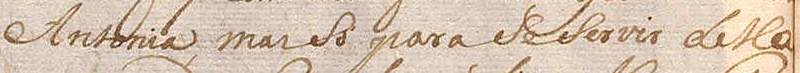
Antonia, mas só para se servir della
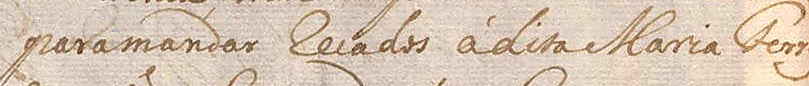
para mandar Recados á dita Maria Ferr_
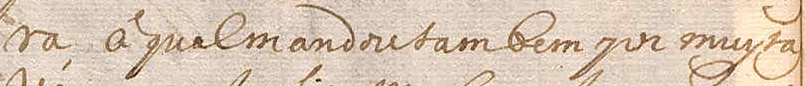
ra, á qual mandou tambem por muytas
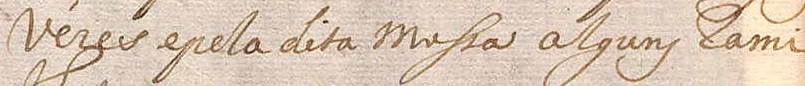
vezes e pela dita mossa alguns Rami
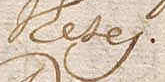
lhetes.
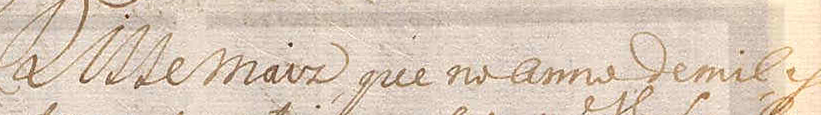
Disse maiz, que no anno de mil, e se
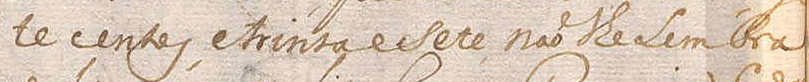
tecentos, e trinta e sete, naõ lhe Lembra
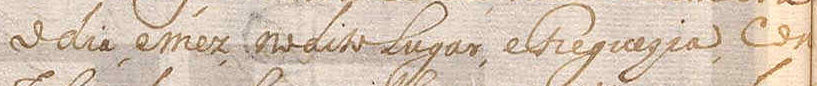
o dia, e mez, no dito Lugar, e Freguezia, con
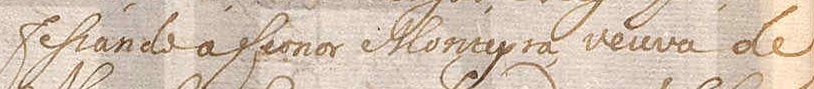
fessando a Leonor Monteyra, veuva de
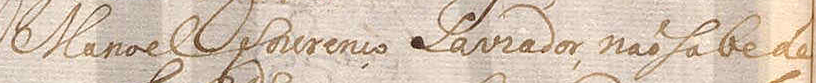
Manoel Lourenço Lavrador, naõ sabe de
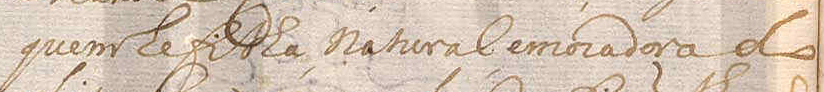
quem he filha, natural e moradora do
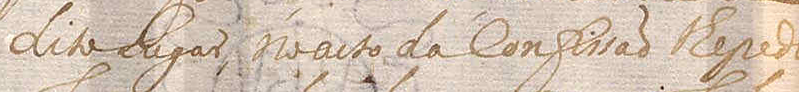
dito Lugar, no acto da Confissaõ lhe ped_
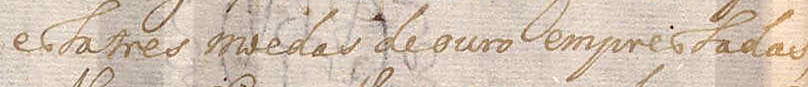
esta tres moedas de ouro emprestadas,
